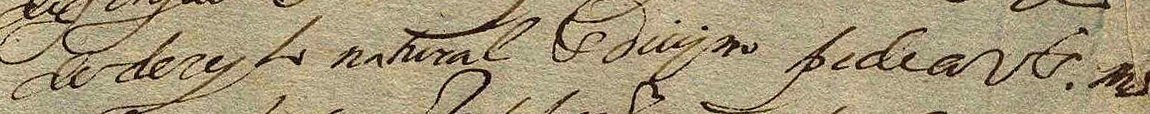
de derejto natural & diujno pede a Vs. ms
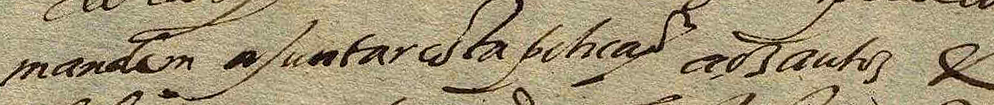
mandem aJuntar esta petiçaõ aos autos &
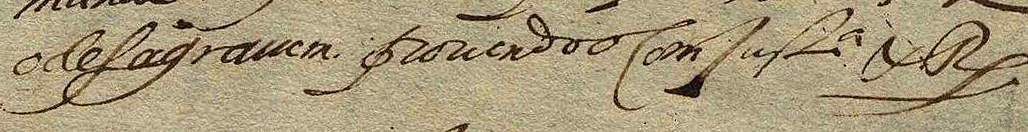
o desagrauem prouendo o Com Justa & Rꝭ
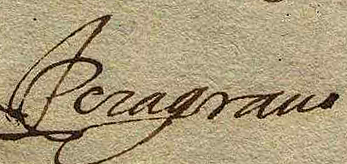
Pera grauo
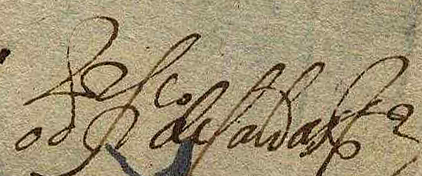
o dtor frco de Caldas pra
